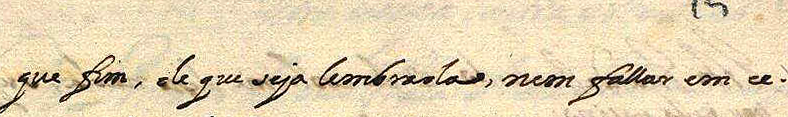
que fim, de que seja lembrada, nem fallar em ce
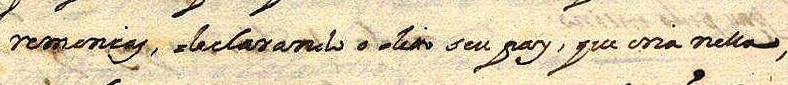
remonias, declarando o ditto seu pay, que cria nella,
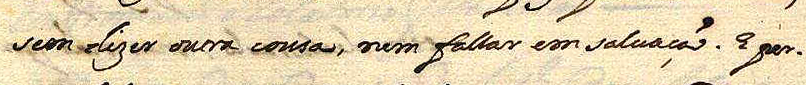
sem dizer outra cousa, nem fallar em saluaçaõ. E per
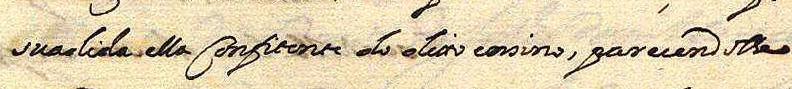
suadida ella Confitente do ditto ensino, parecendolhe
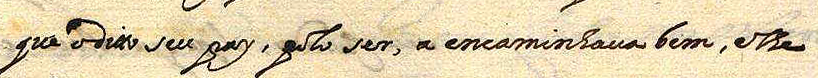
que o ditto seu pay, polo ser, a encaminhaua bem, e lhe
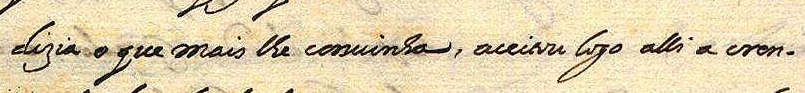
dizia o que mais lhe conuinha, aceitou logo alli a cren
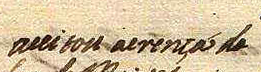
aceitou a crença da
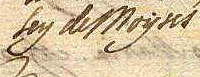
ley de Moyses
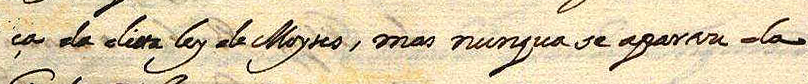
ça da ditta ley de Moyses, mas nunqua se apartou da
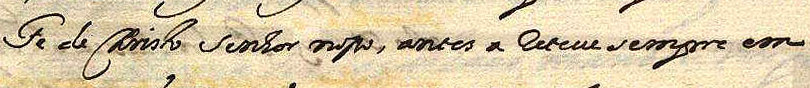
Fe de Christo Senhor nosso, antes a Reteue sempre em
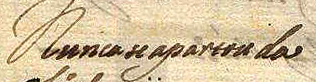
Nunca se apartou da
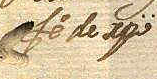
fé de xpō
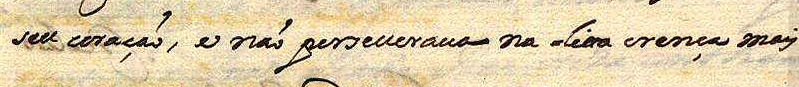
seu coraçaõ, e naõ perseueraua na ditta crença mais
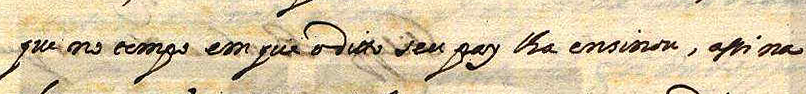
que no tempo em que o ditto seu pay lha ensinou, assi na
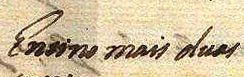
Ensino mais duas
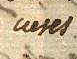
ueses
